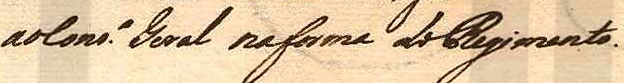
ao Cons.o Geral na forma do Regimento.
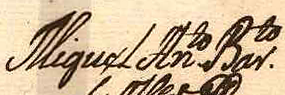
Miguel An.to Bar.to
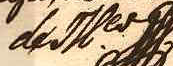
de M.co
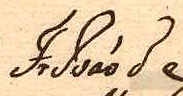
Fr Ioaõ de
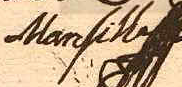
Mansilha
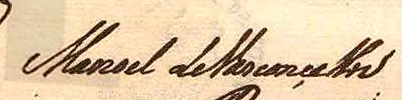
Manoel de Vasconcellos
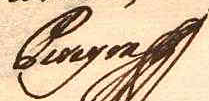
Pereyra
